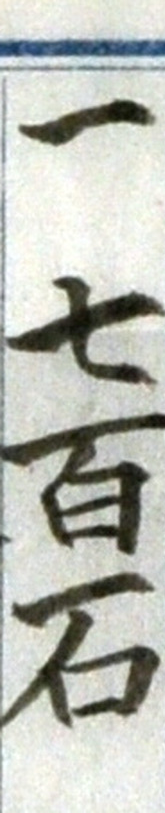一七百石
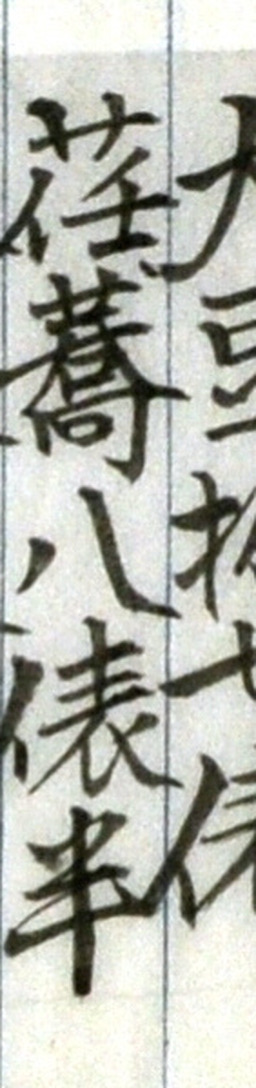荏蕎八俵半
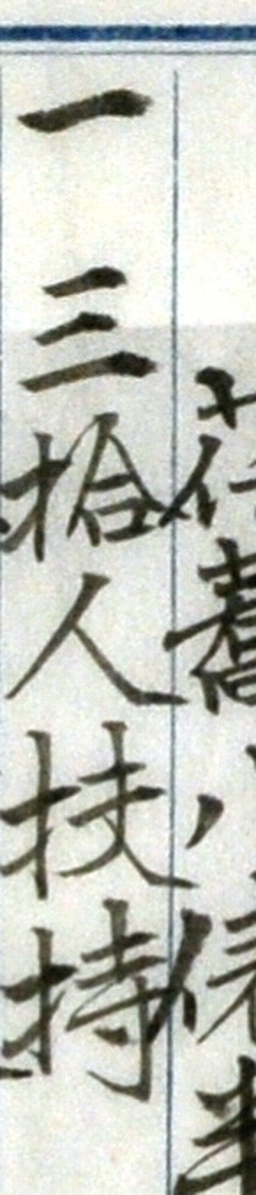一三拾人扶持
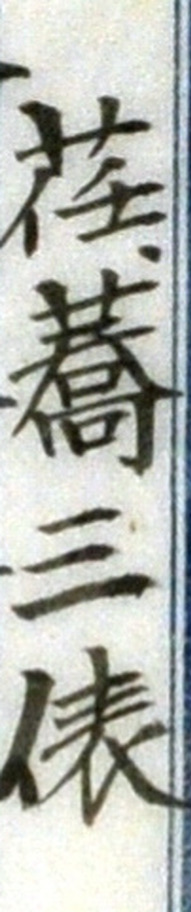荏蕎三俵
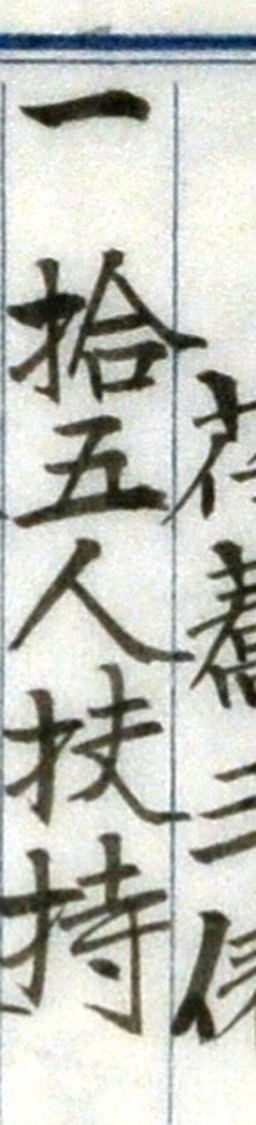一拾五人扶持
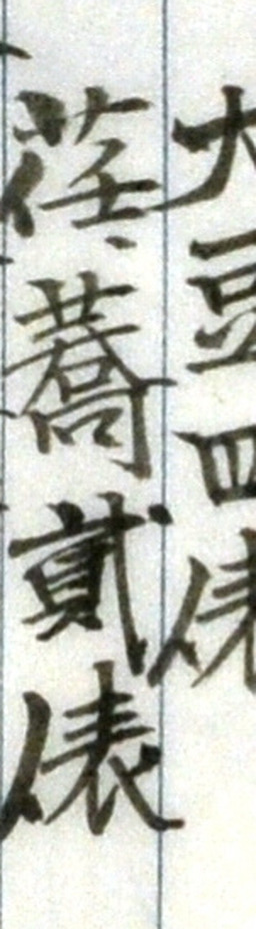荏蕎弐俵
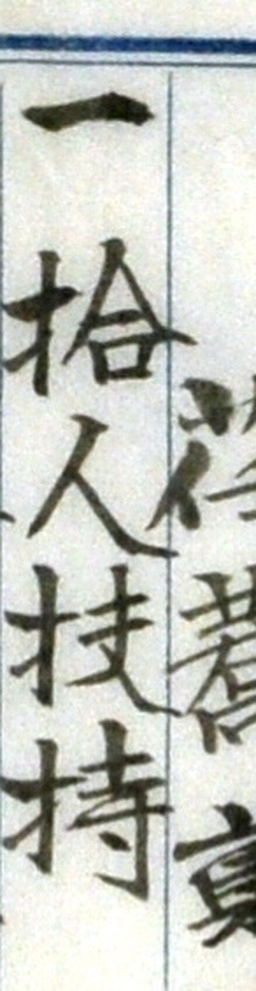一拾人扶持
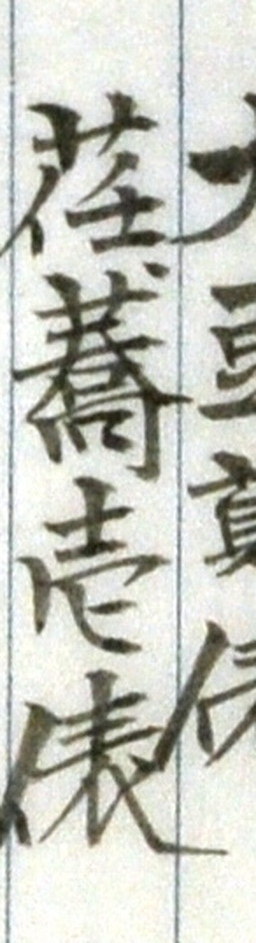荏蕎壱俵
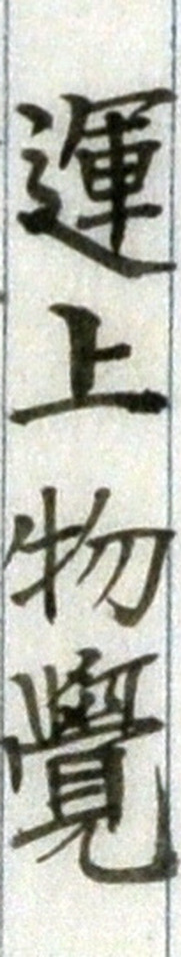運上物覚

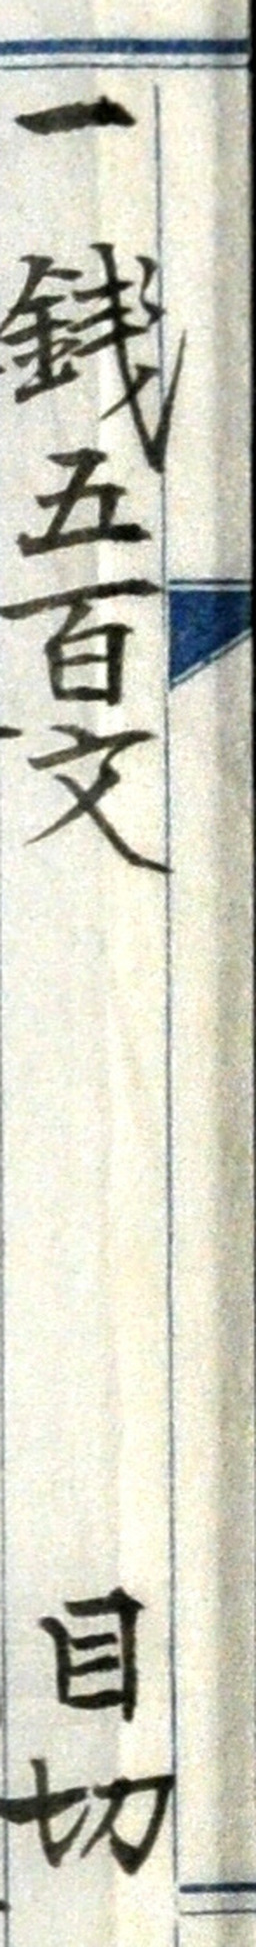一銭五百文目切
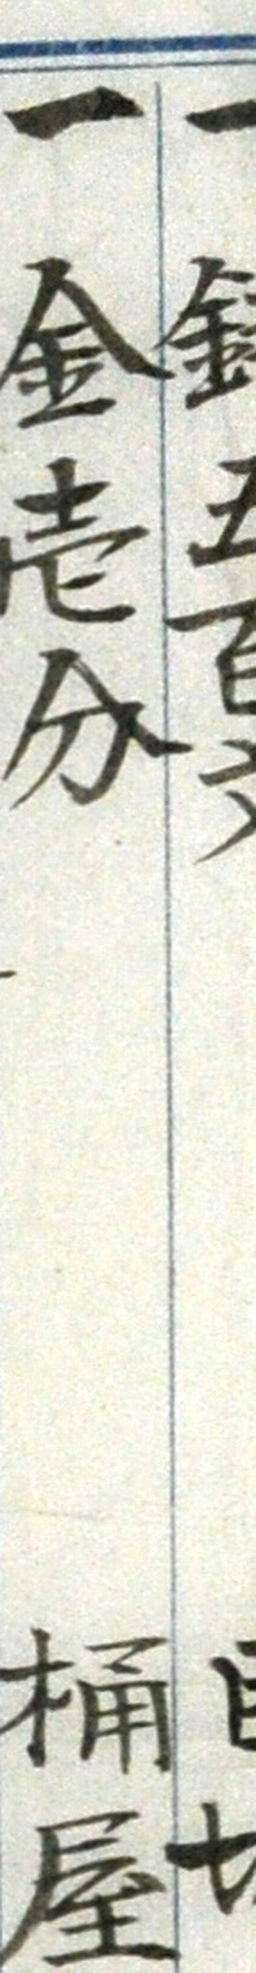一金壱分桶屋
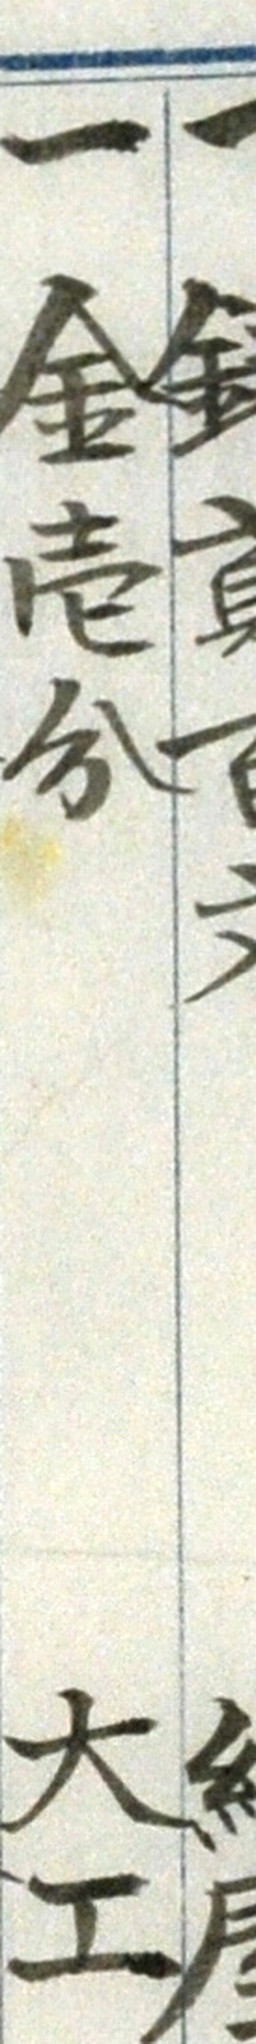一金壱分大工
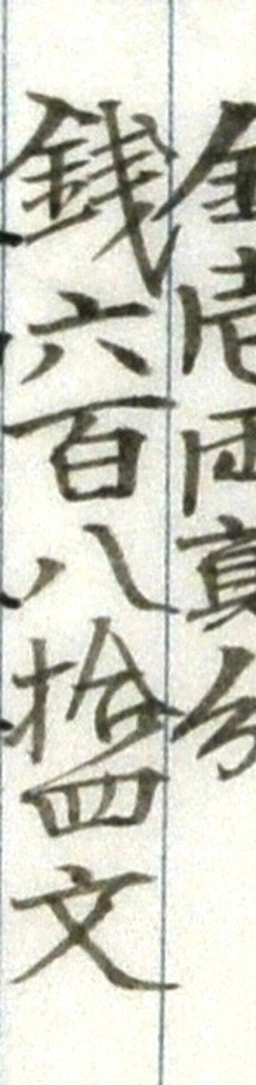銭六百八拾四文
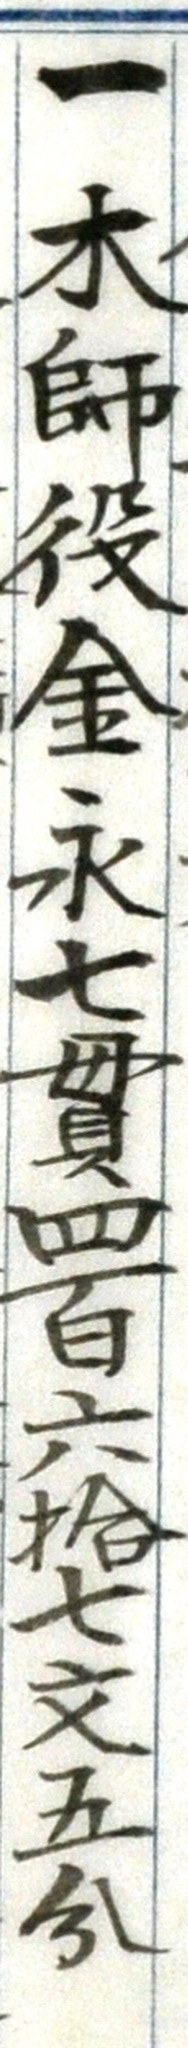一木師役金永七貫四百六拾七文五分
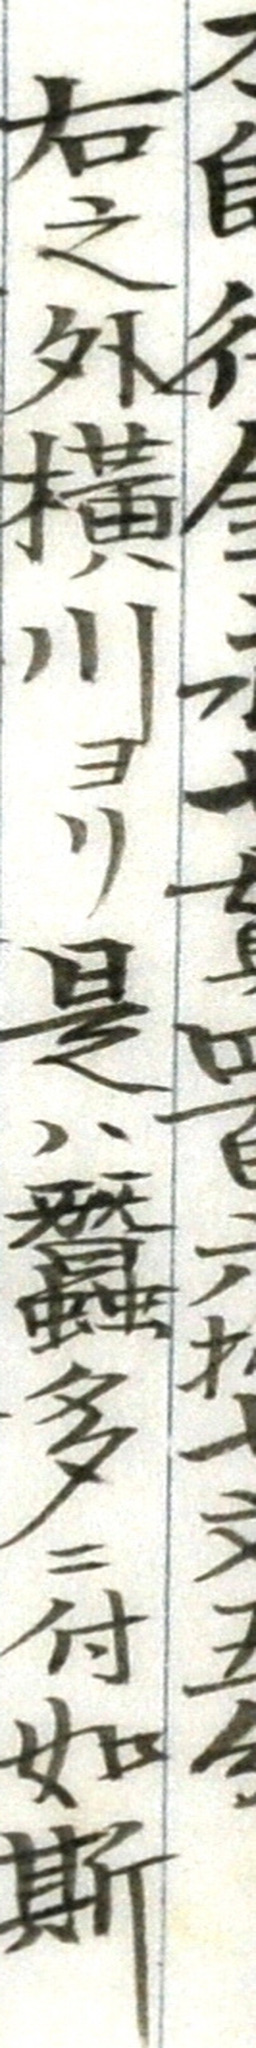右之外横川ヨリ是ハ蚕多ニ付如書く斯
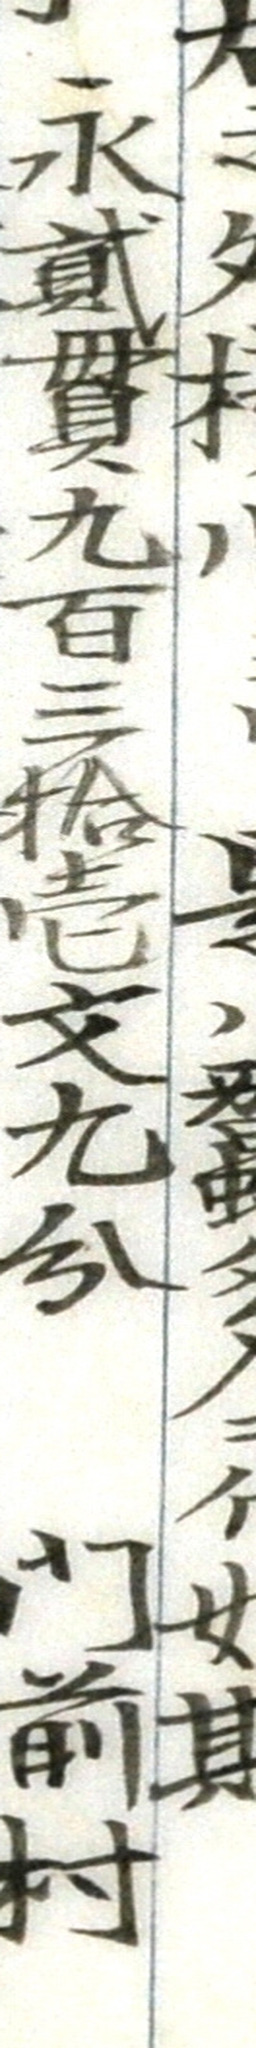内永弐貫九百三拾壱文九分門前村
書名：御定法
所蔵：伊那市立高遠町図書館・合同会社AMANE
